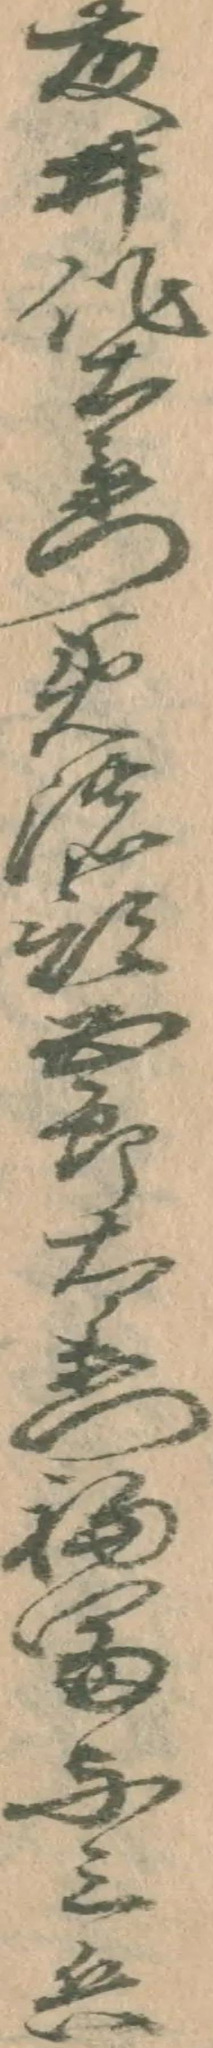藤井作右衛門美濃願五郎右衛門福冨与三兵
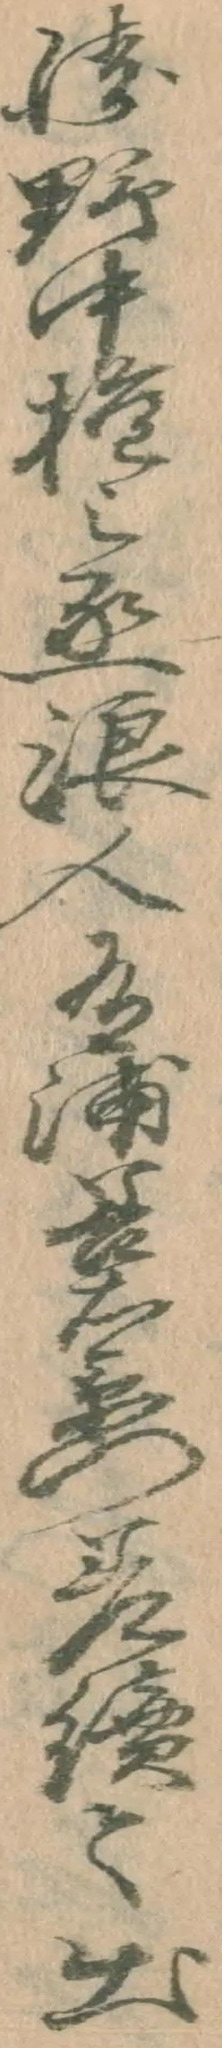衛野野中権之丞浪人有浦善右衛門差続て出
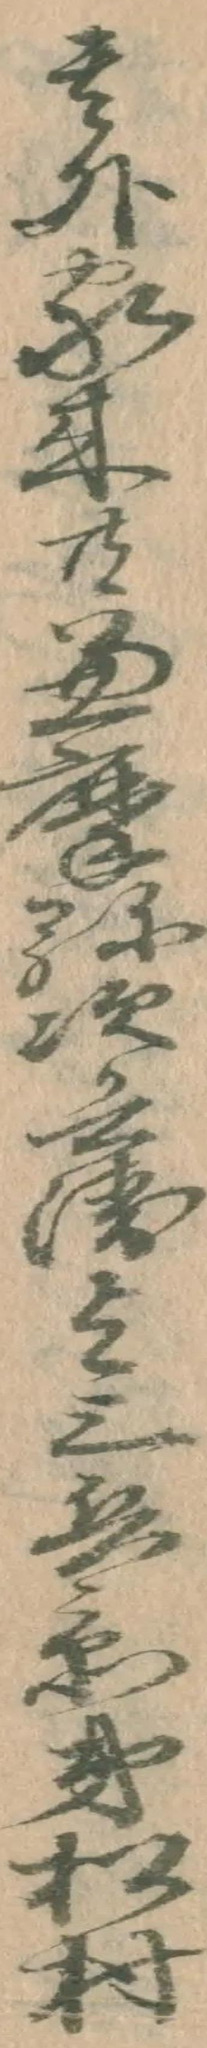其外家来共兼摩弥次兵衛与三兵衛弟松村
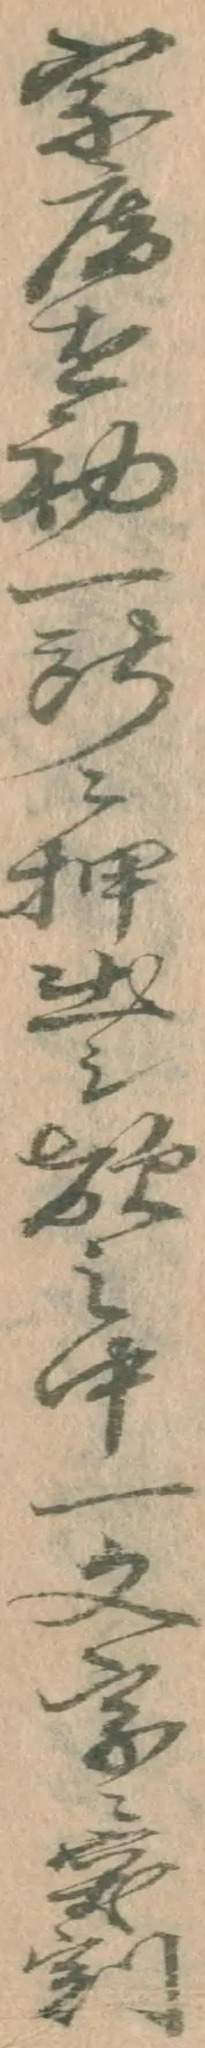宗広を初一所に押出し敵之中一文字に突割
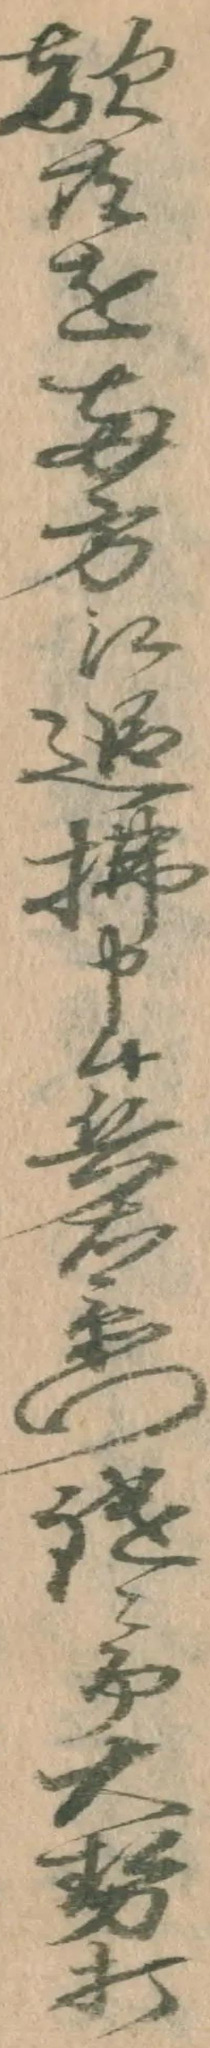敵共を両方江追払申候兵右衛門鑓に而大勢打
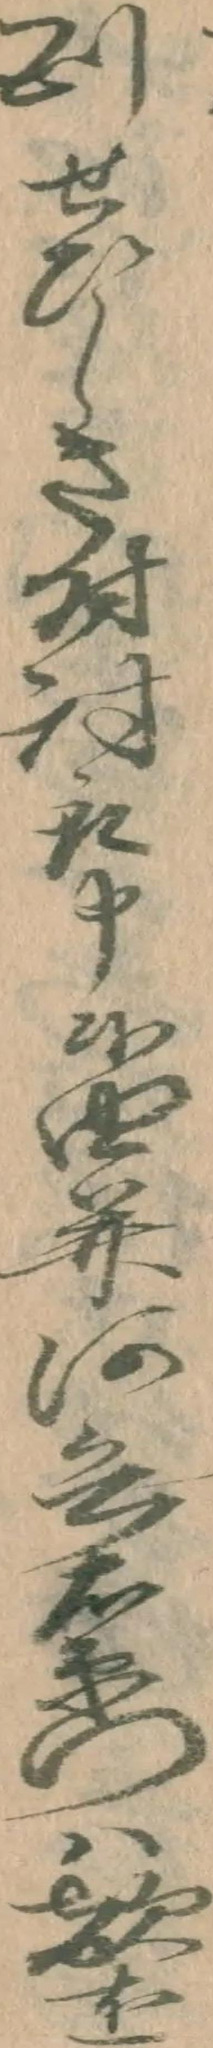別せひしき付討取申候由並河兵右衛門は敵を
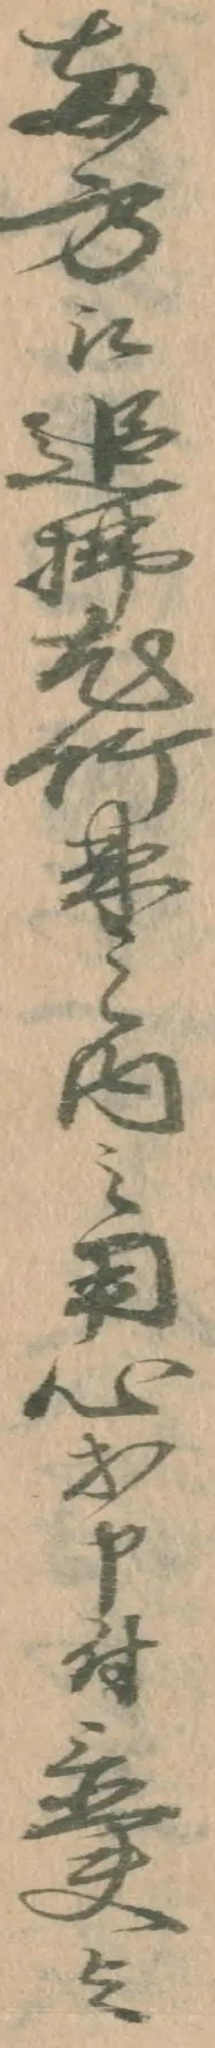両方江追払尤竹束之内之用心等申付置夫与
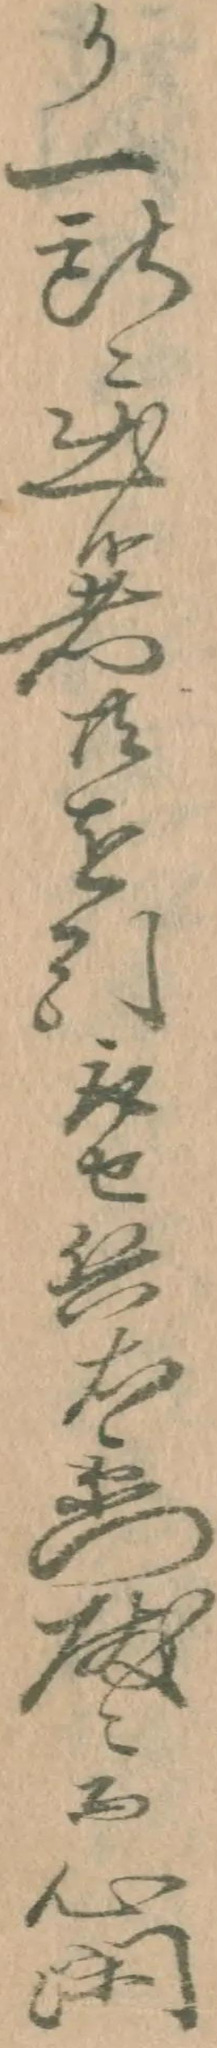り一所に出候者共を引取せ兵右衛門に而心閑
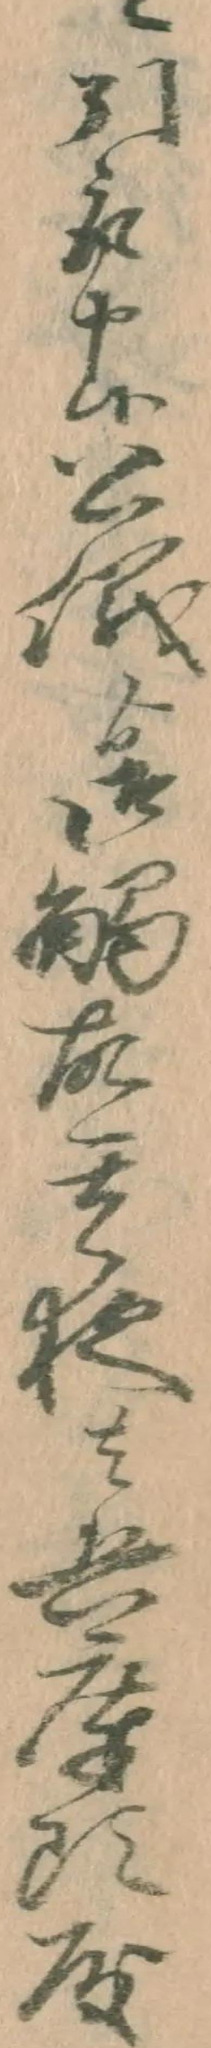に引取申候公儀ゟ御觸故其夜者兵庫頭殿
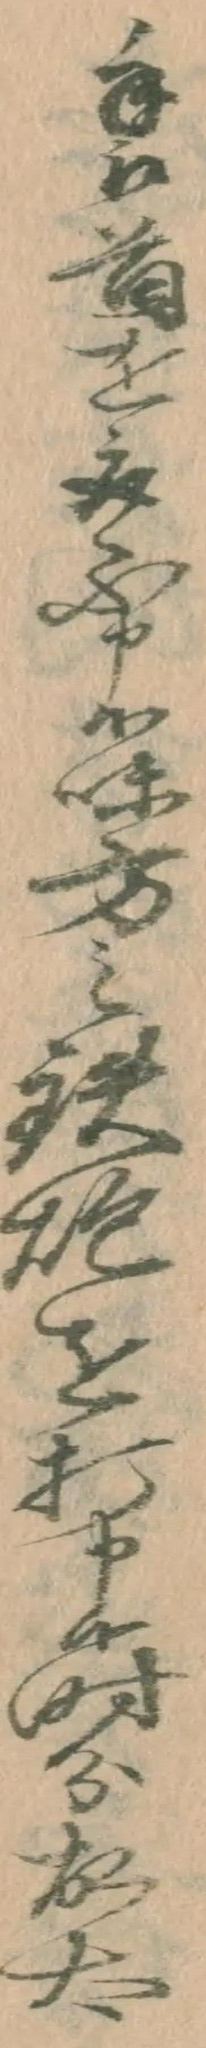手江首を取ふ申候味方之鉄炮を打申候時分故太
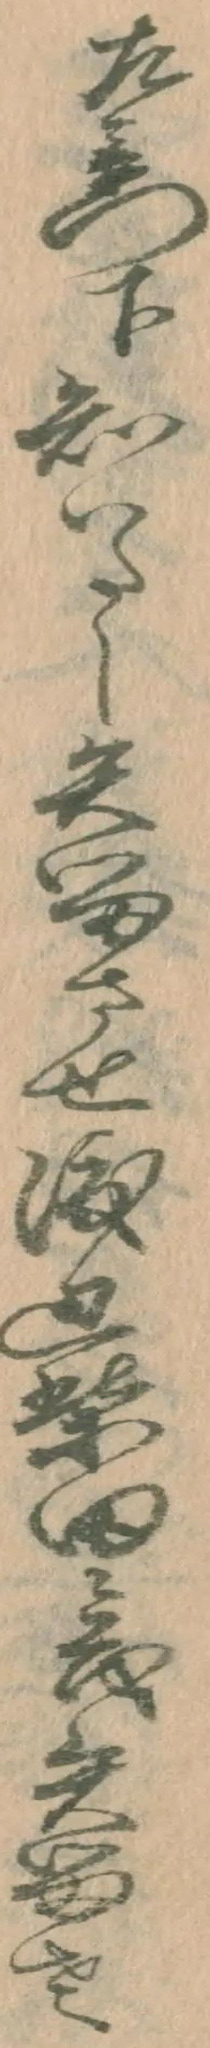左衛門下知いたし矢留させ渡辺柴田に茂矢留さ
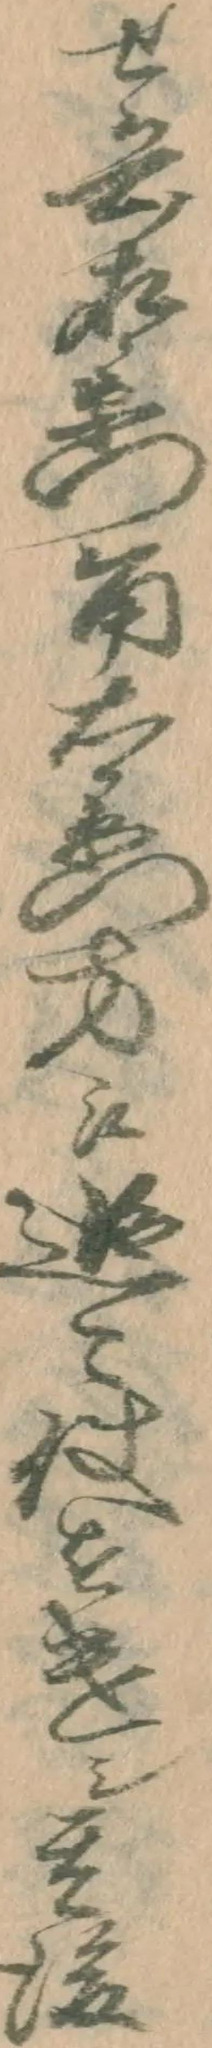せ兵左衛門角右衛門方江追々使を遣し其後
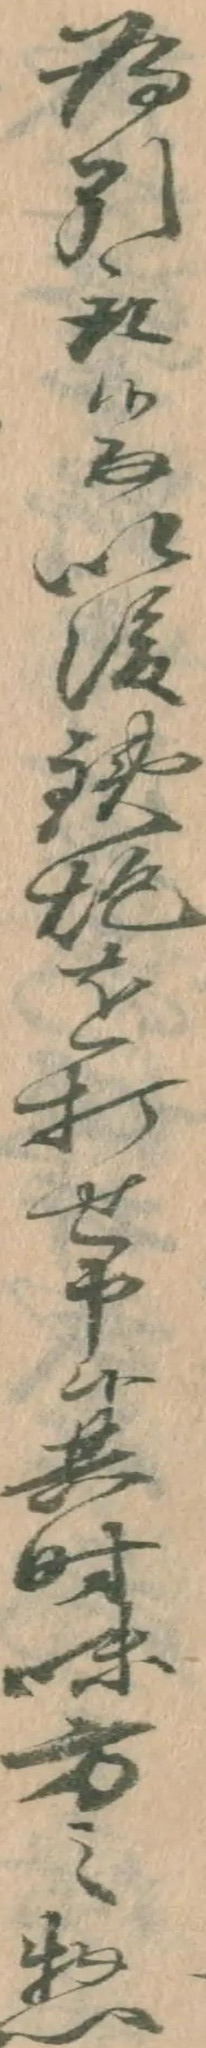為引取候而以後鉄炮を打せ申候其時味方之惣
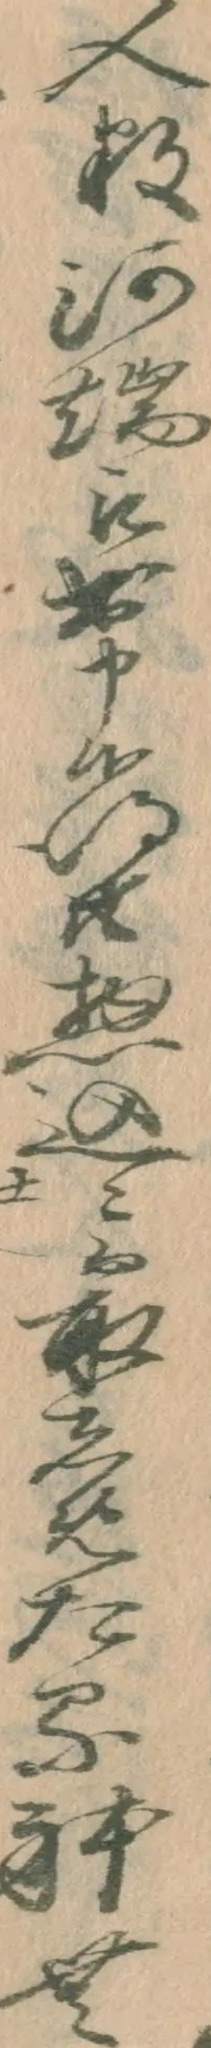人数河端江出申候得共惣込に而取志免た累躰無
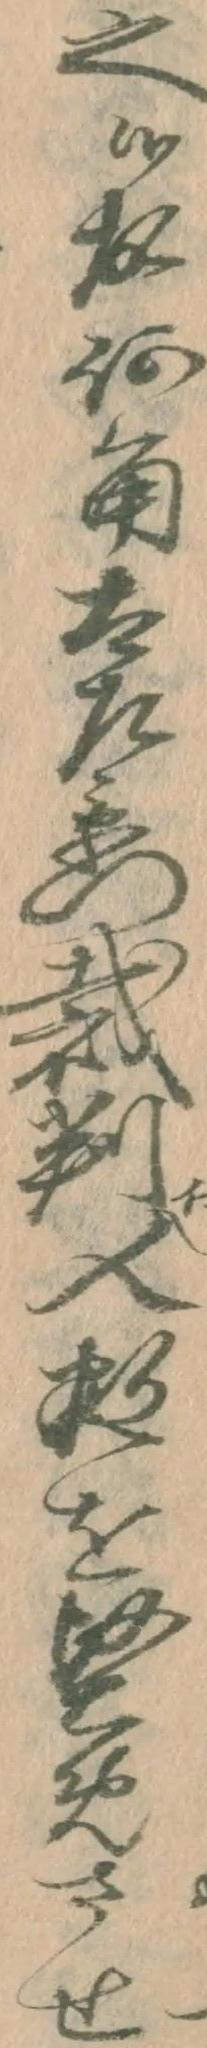之候故何角太左衛門裁判仕人数を堅免させ
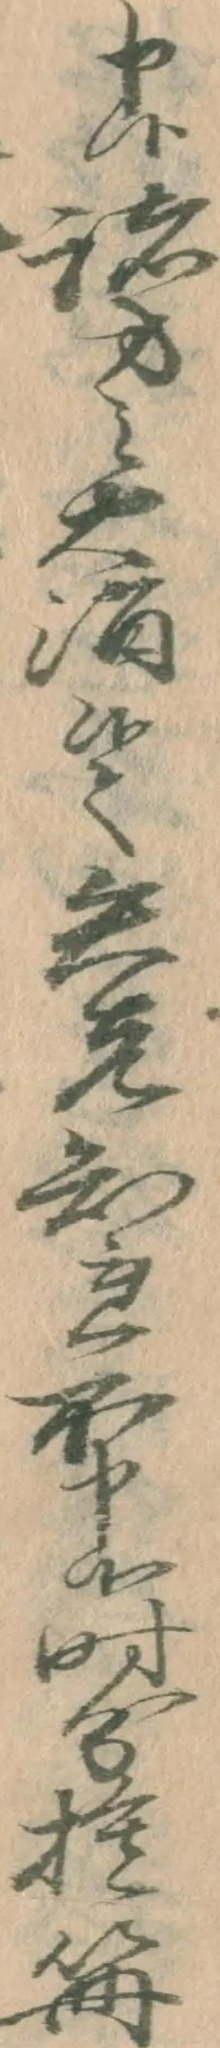申候諸方之火消候て矢先知連不申候時分捨篝
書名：切支丹御退治記 49巻. [7]
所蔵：国立国会図書館 National Diet Library, JAPAN
